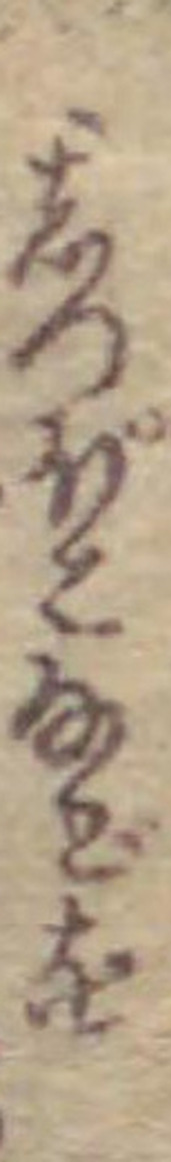しつぽこなどを
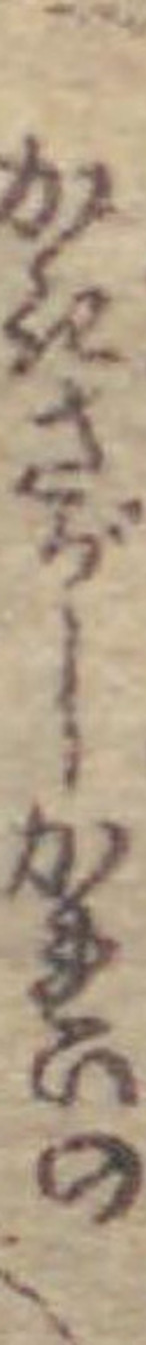かきさがしかれいの
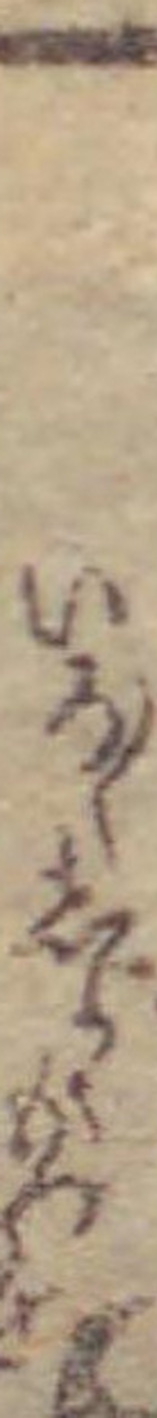いろ〳〵しよくもつを
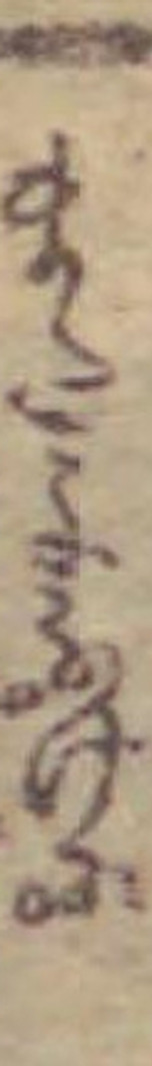またよふけに
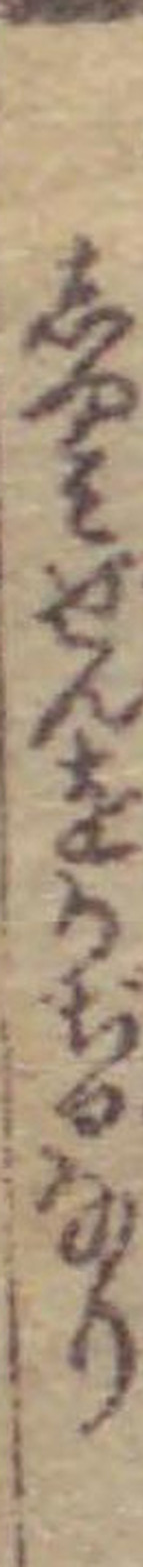しやみせんをかぢるなり

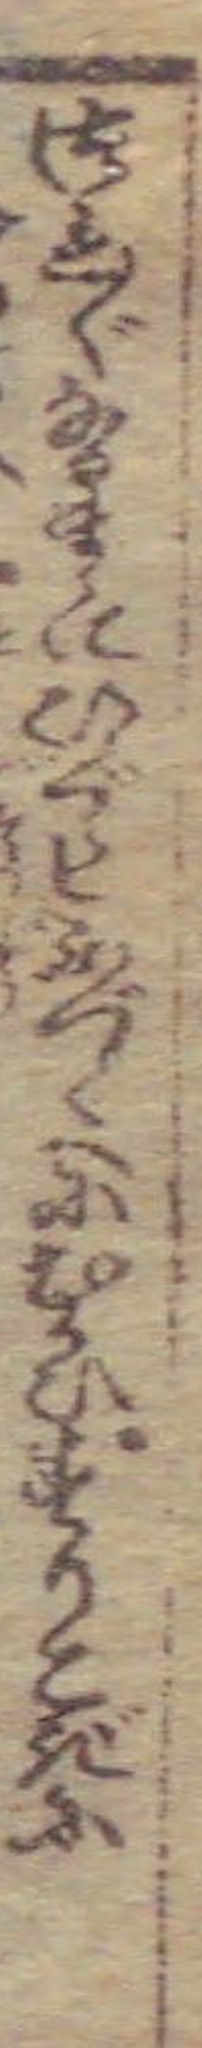つれ〴〵なるまゝにひぐらしふづくへにむかひ。すりこぎに
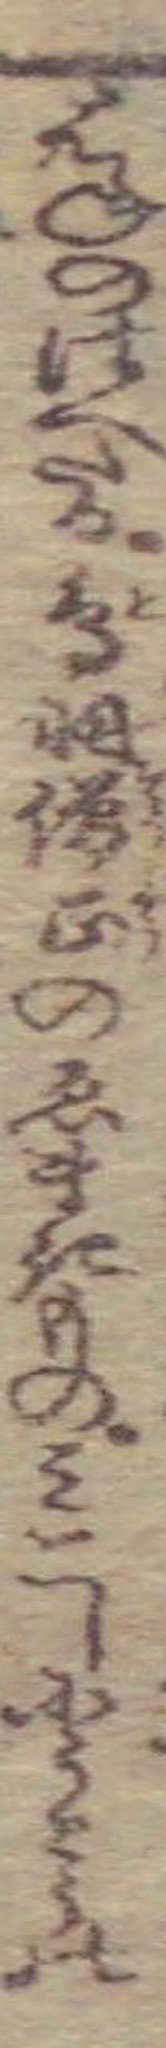はねのはへたる。鳥羽僧正のえまきもの。みこしにうとうの
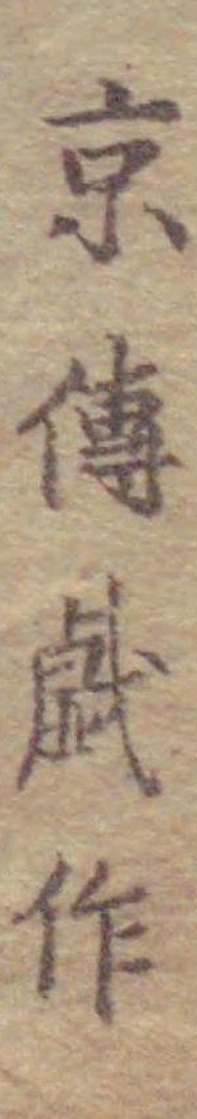京伝戯作
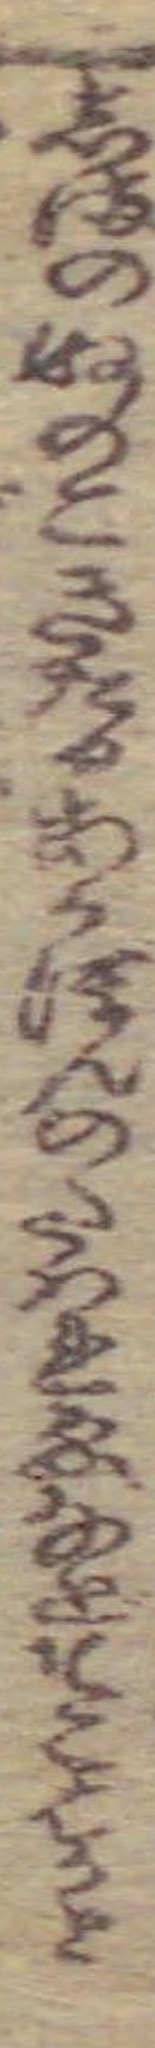しまのぬのこきたるあかぼんのたはれゑなどそこはかと
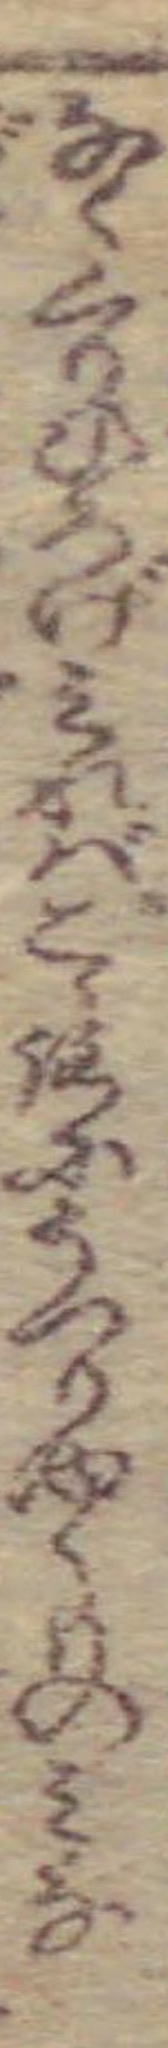なくくりひろげみれば。こゝろにうつりゆくものみな
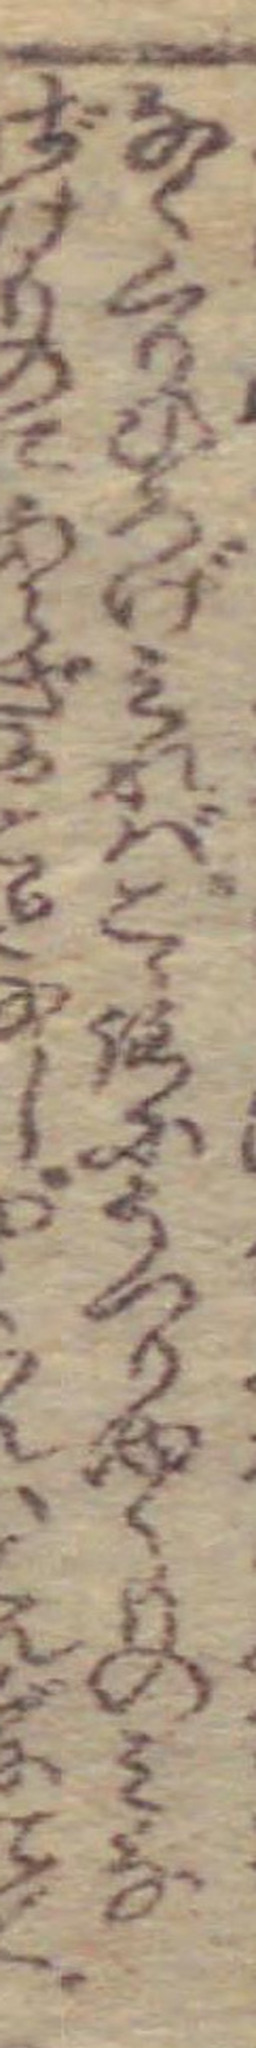ばけものにあらざることなし。やくはんはてんぐにて。
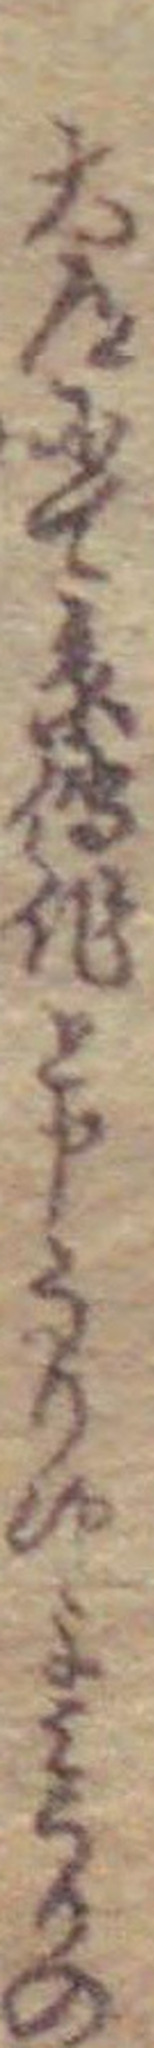大道にて京伝作と申うり候よみうりの
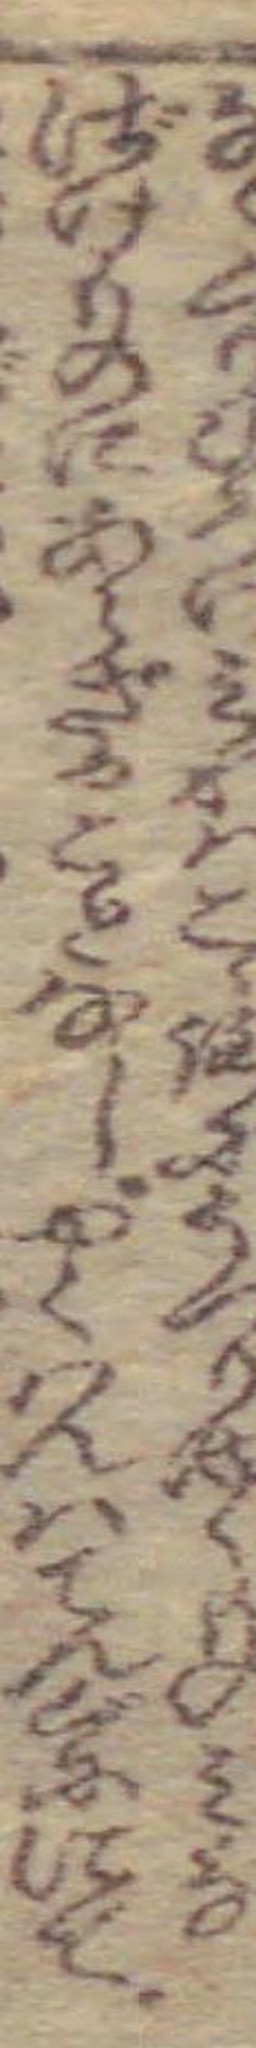ばけものにあらざることなし。やくはんはてんぐにて。
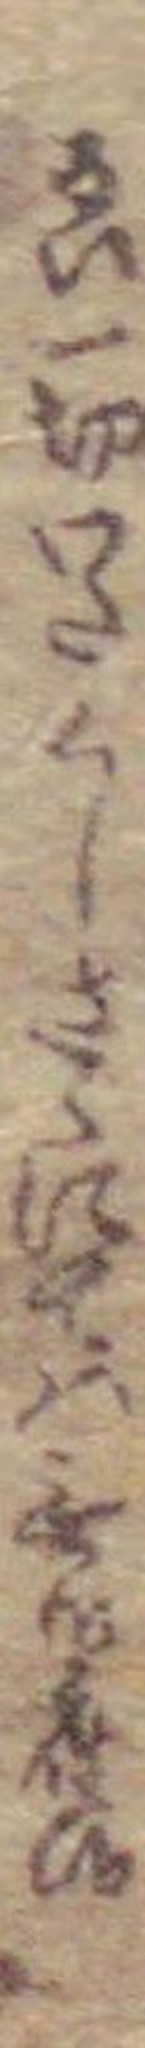るい一切わたくしさくにては無御座候
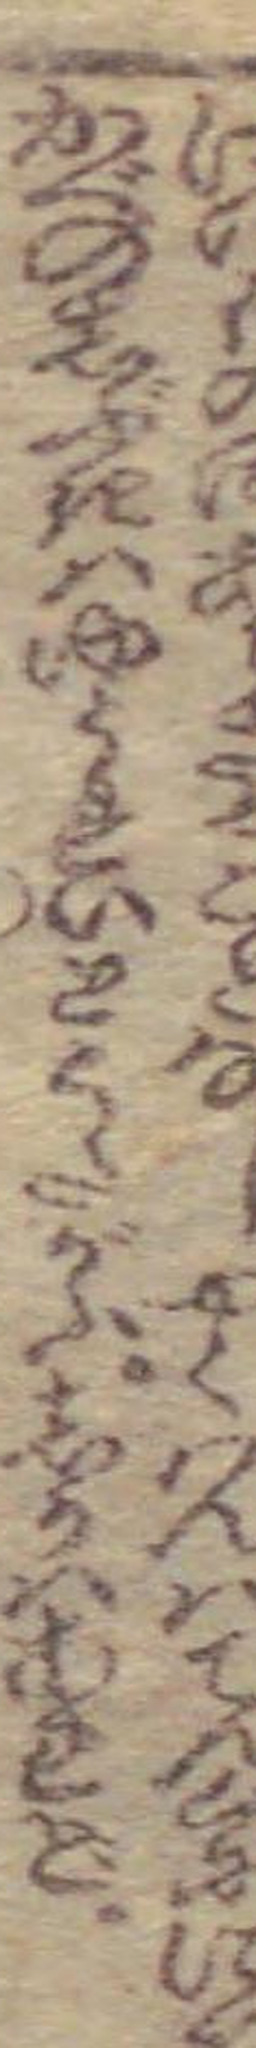かべのしぶきはゆうれいとうたがふ。しかはあれど。
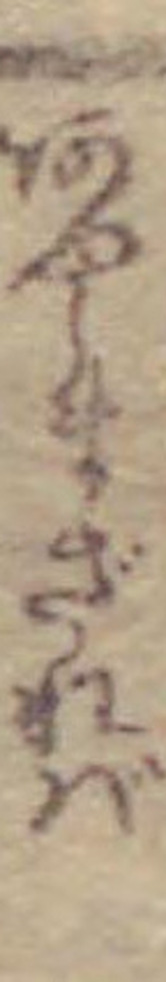あやしまざれば
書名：化物和本草 : 3巻
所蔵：国立国会図書館 National Diet Library, JAPAN
